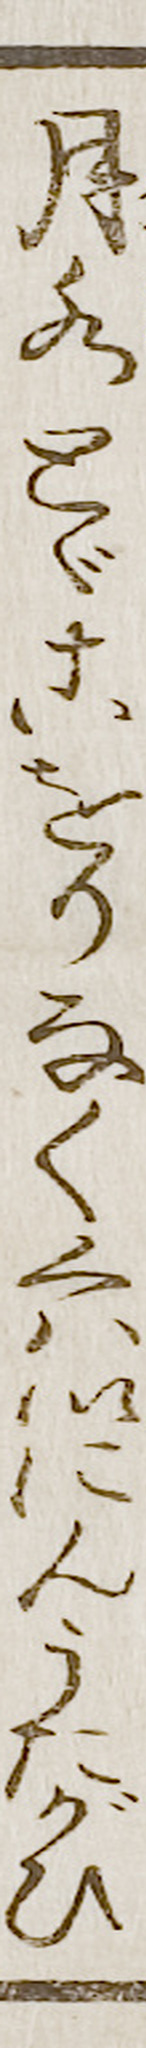月水とゞこをりなくくハいにんうたゞひ
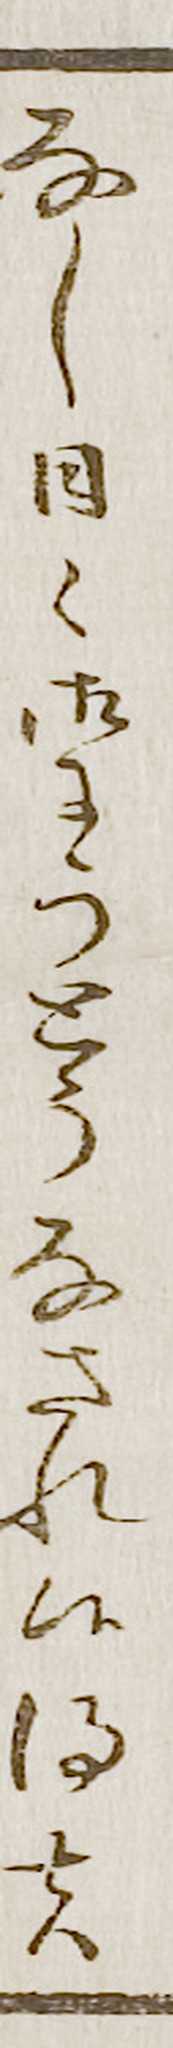なし日〻御にうとうなされ候得は
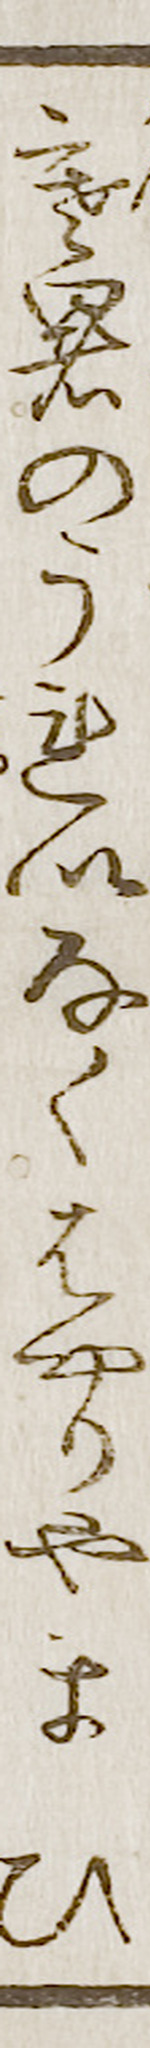寒暑のうれいなくはやりやまひ
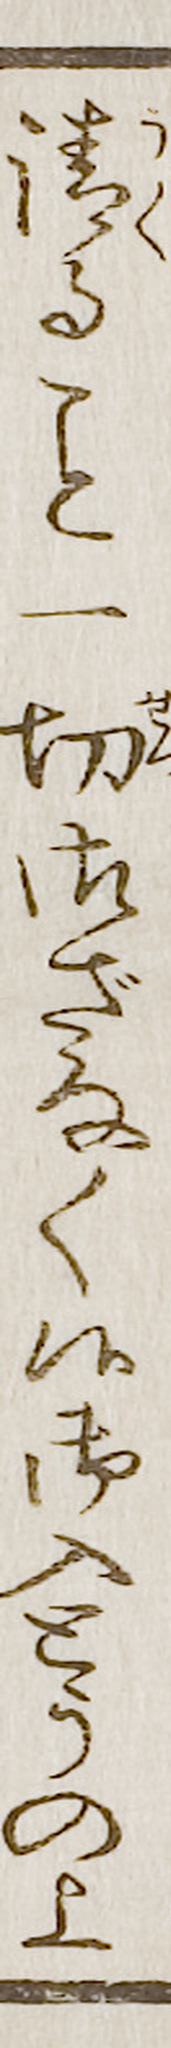請ること一切御ざなく候御入とうの上
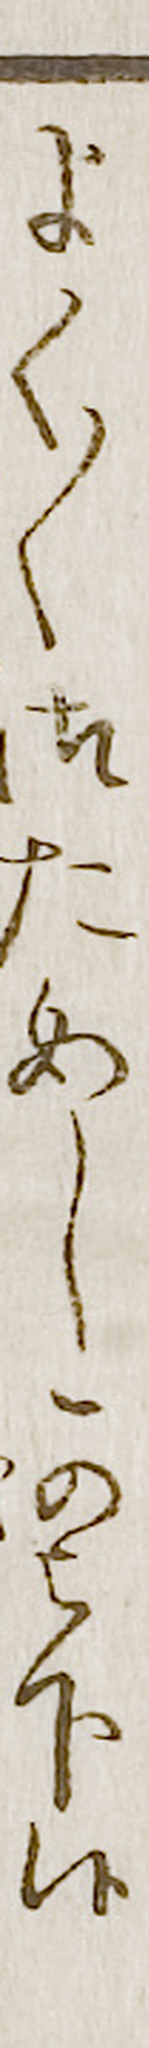よく〳〵御ためし可被下候
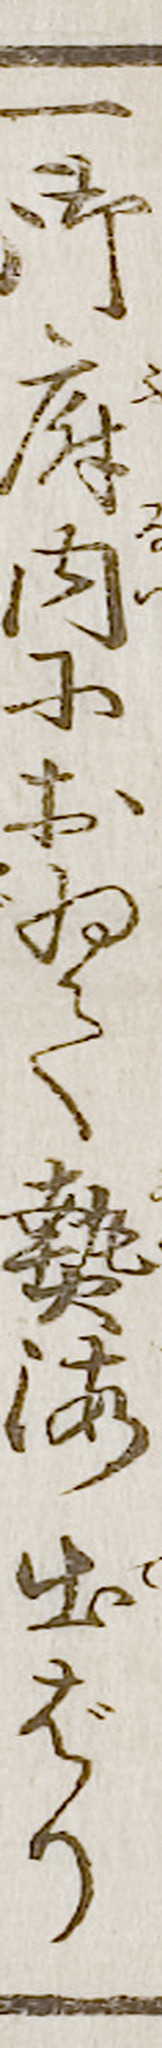一御府内におゐて熱海出ばり
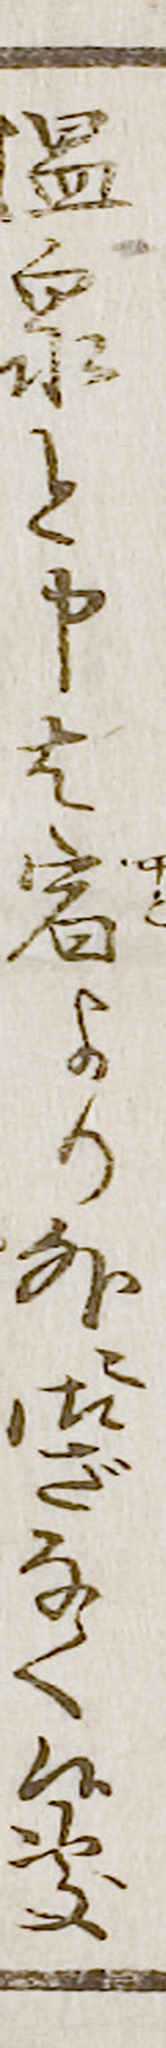温泉と申は宿より外ニ御ざなく候處
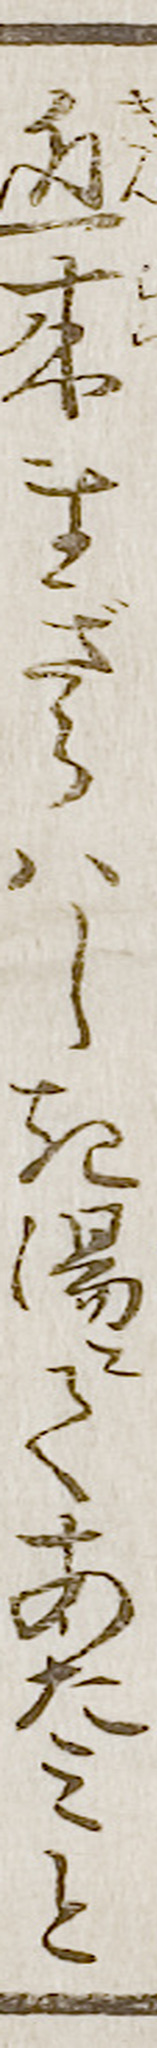近来まぎらハしき湯ニてあたミと
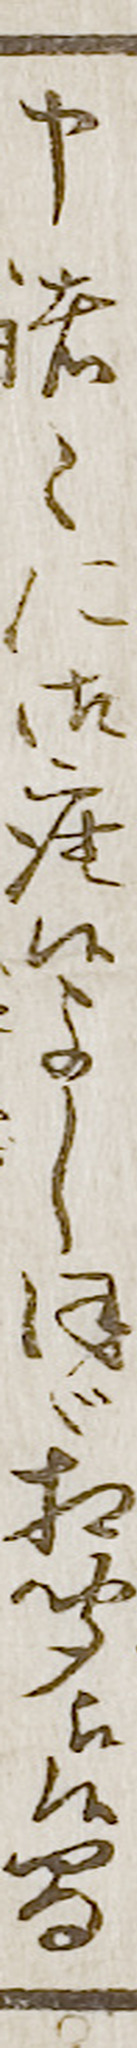申諸〻に御座候よしほゞ相聞え候間
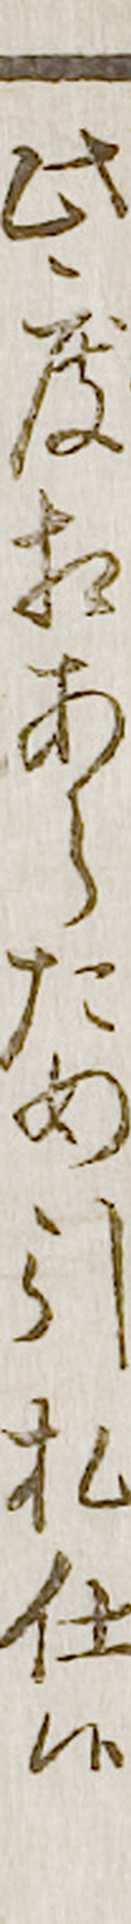此度相あらため引札仕候
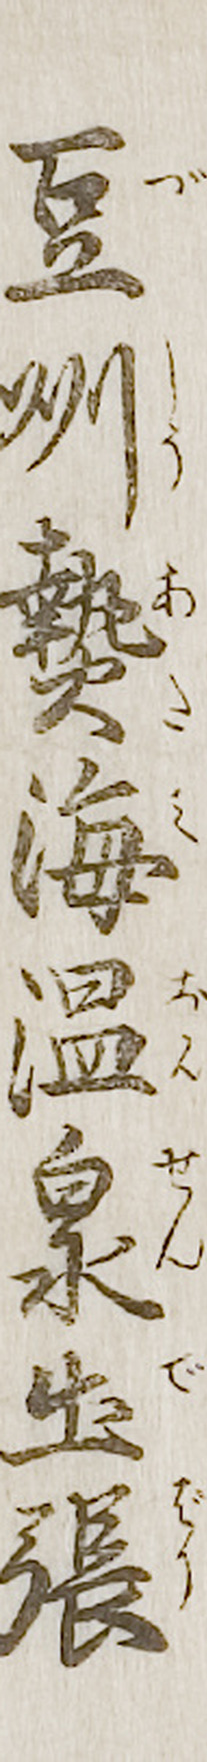豆州熱海温泉出張
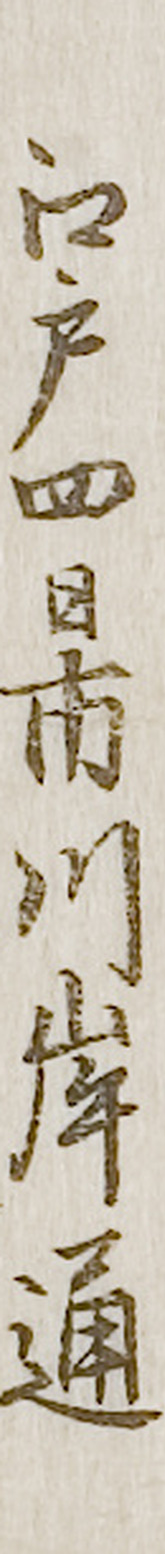江戸四日市河岸通
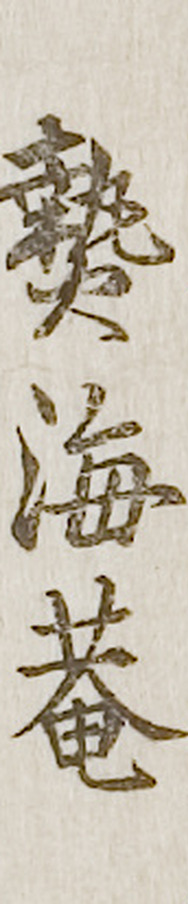熱海菴
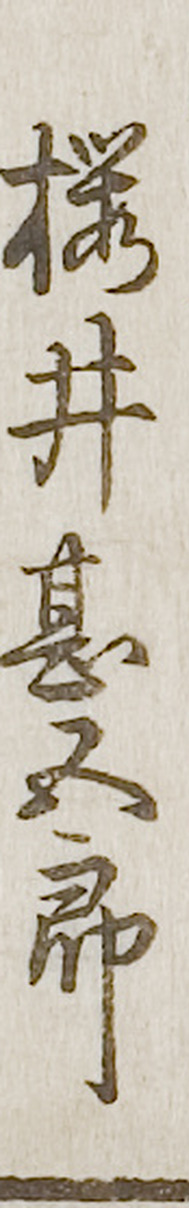櫻井甚五郎
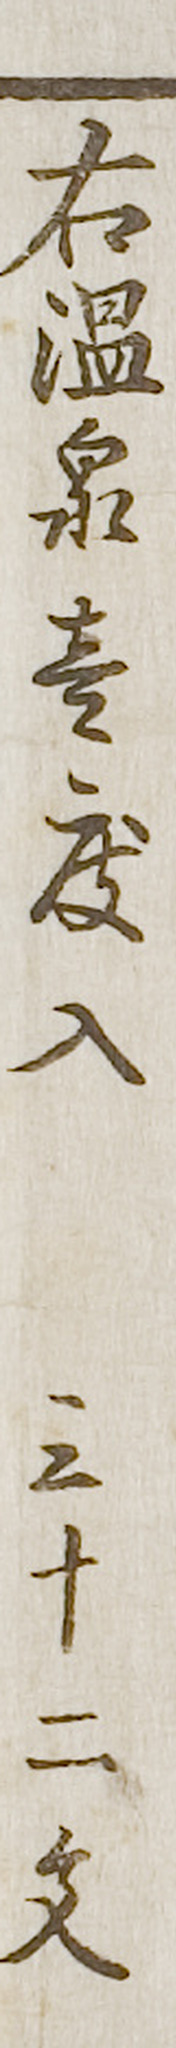右温泉壱度入三十二文
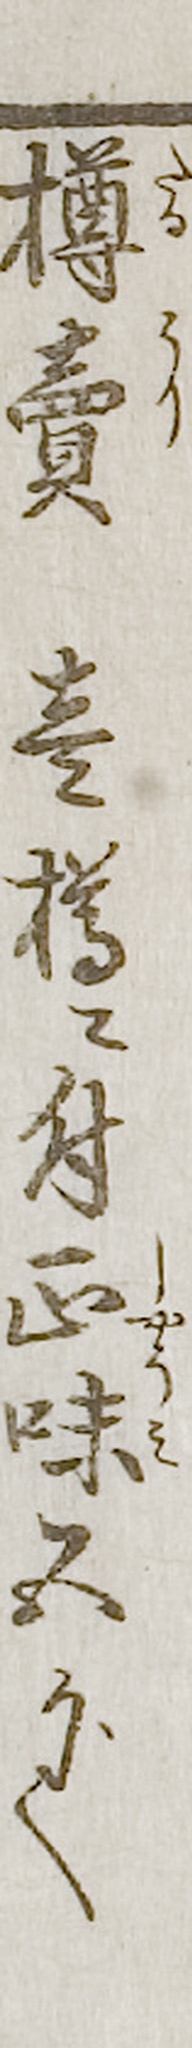樽賣壱樽ニ付正味五匁
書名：[豆州熱海温泉引札]
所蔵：東京大学総合図書館 General Library in the University of Tokyo, JAPAN
